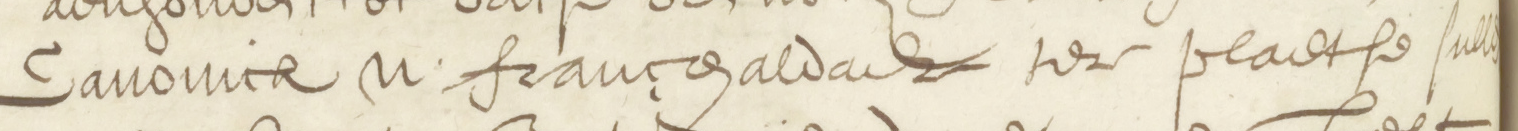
Canonick n. francen aldaer ter plaetse sullen
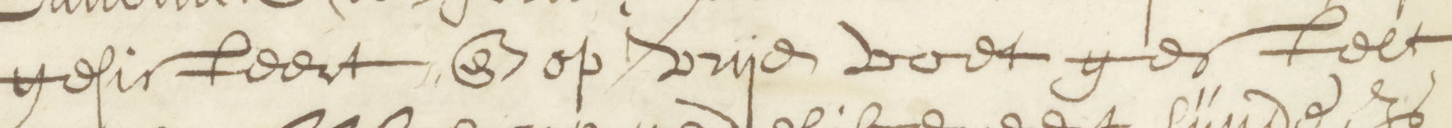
gesisteert, & op vrije voet gestelt
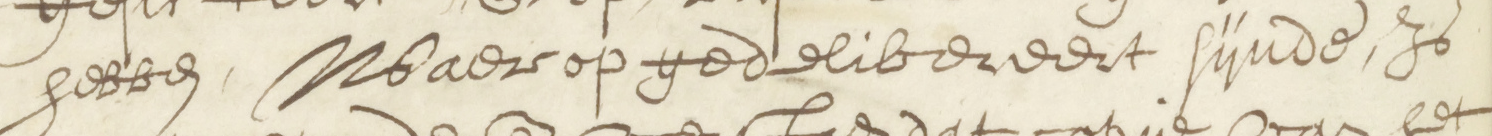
hebben. Waer op gedelibereert sijnde, Is
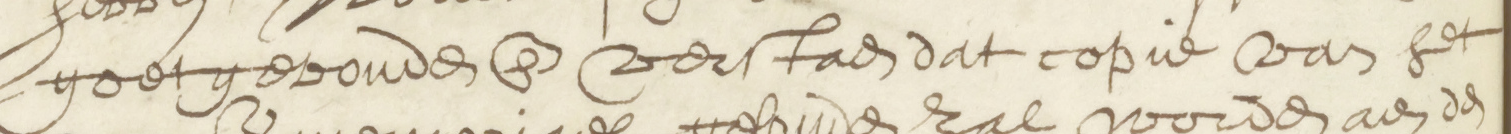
goetgevonden & verstaen dat copie van het
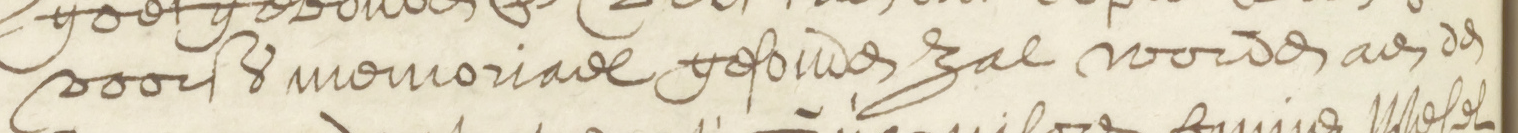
voorss memoriael gesonden zal worden aen den
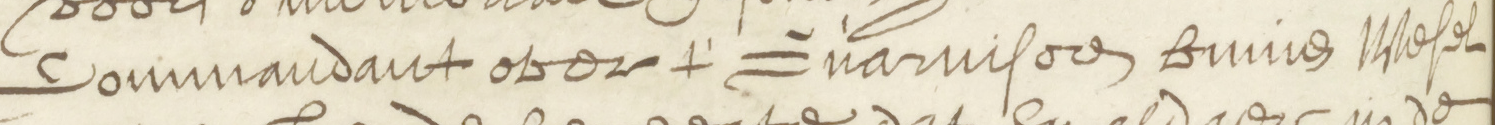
Commandant over t‛ Guarnisoen binnen Wesel
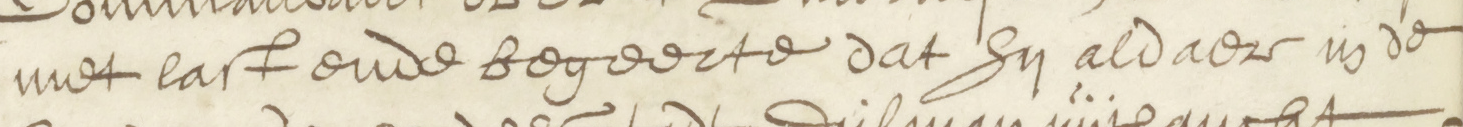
met last ende begeerte dat hij aldaer inde
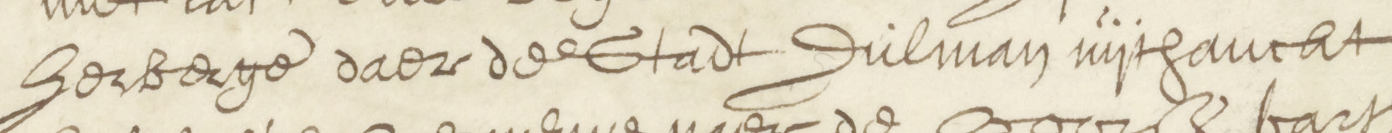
herberge daer de Stadt Dulman uijthanckt
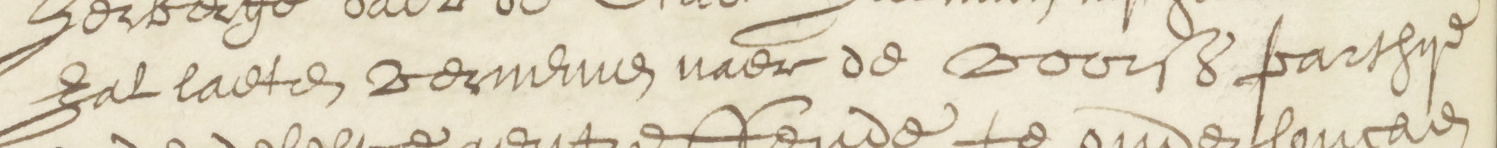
zal laeten vernemen naer de voorss parthije
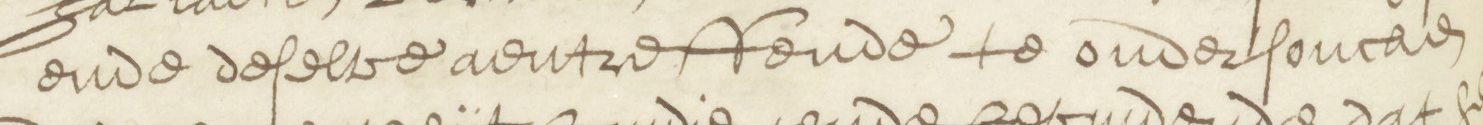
ende deselve aentreffende te ondersoucken
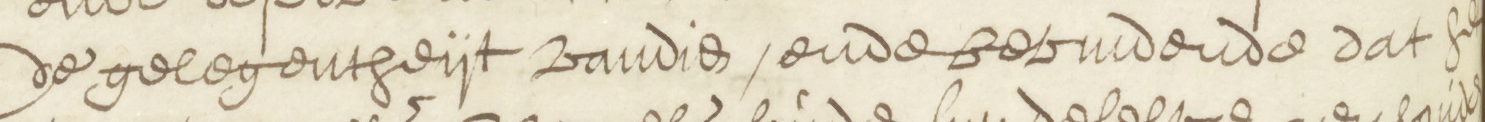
de gelegentheijt vandien, ende bevindende dat he
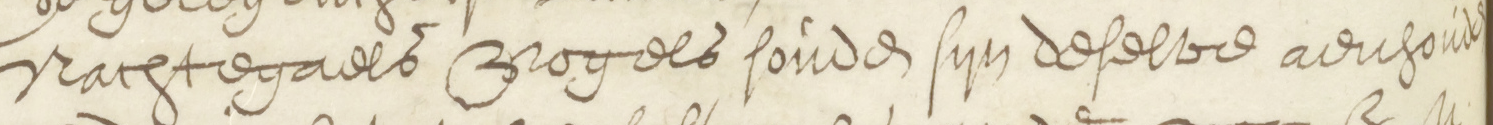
Nachtegaels Vogels souden sijn deselve aenhoude
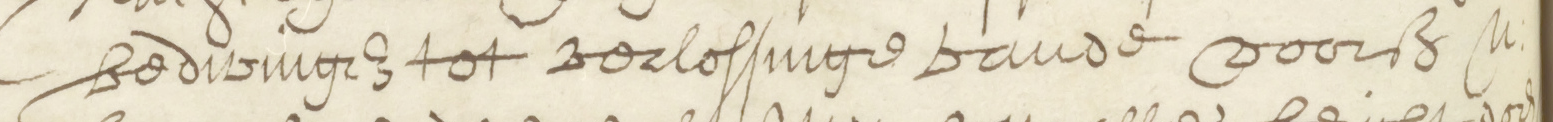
bedwingen tot verlossinge vande voorss. N.
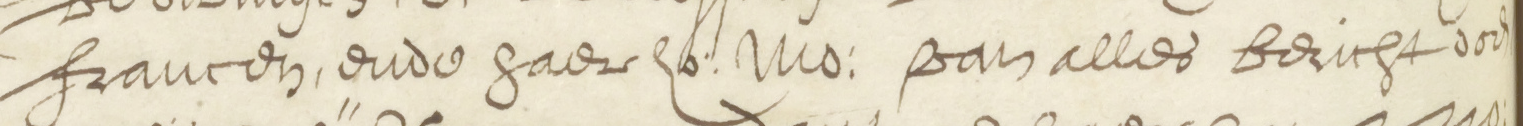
francen, ende haer ho:Mo: van alles bericht doen
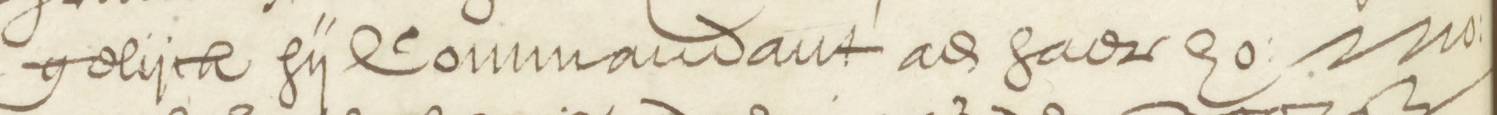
gelijck hij Commandant aen haer ho:Mo:
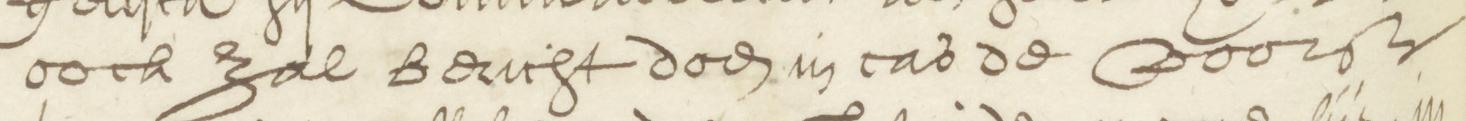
oock zal bericht doen in cas de voorss.
